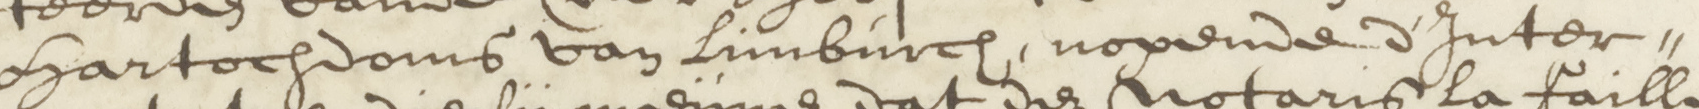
Hartochdoms van Limburch, nopende d‛ Inter„
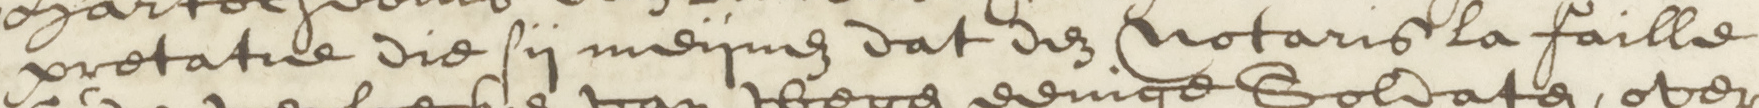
pretatie die sij meijnen dat den notaris la Faille
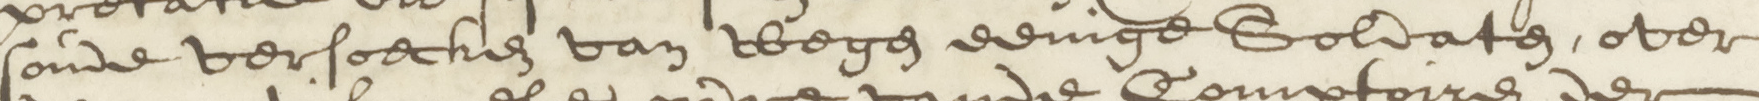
soude versoecken van wegen eenige Soldaten, over
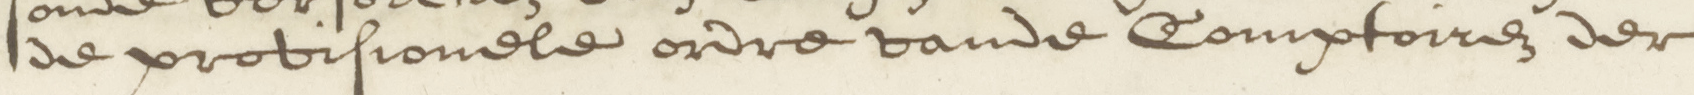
de provisionele ordre vande Comptoiren der
